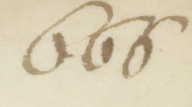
666
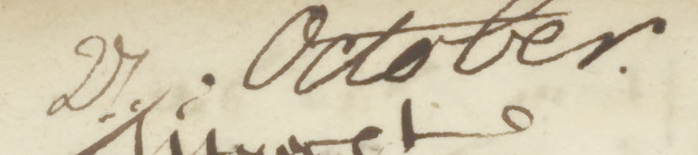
27. October.
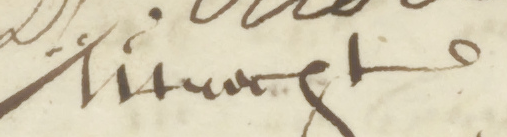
Utrecht
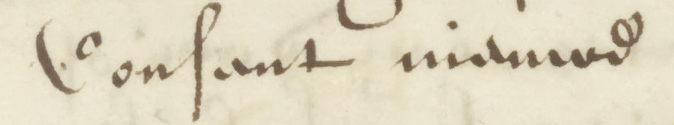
Consent nieuwe
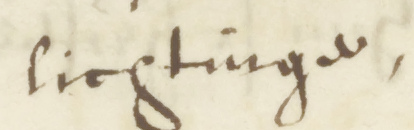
lichtinge.
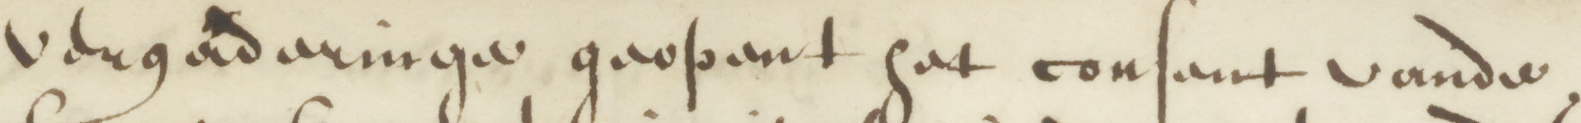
vergaderinge geopent het consent vande
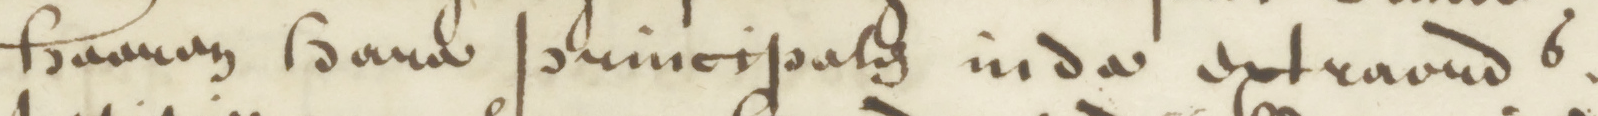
heeren hare principalen in de extraords
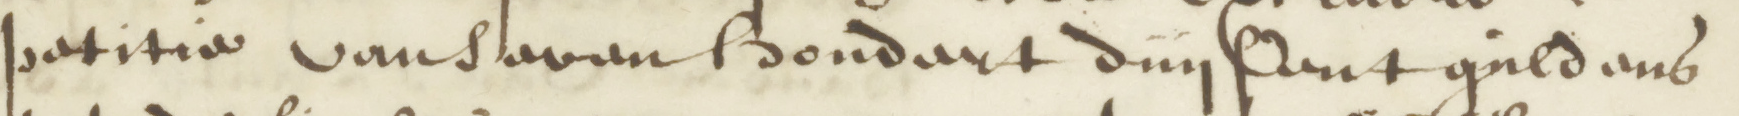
petitie van seven hondert duijsent guldens
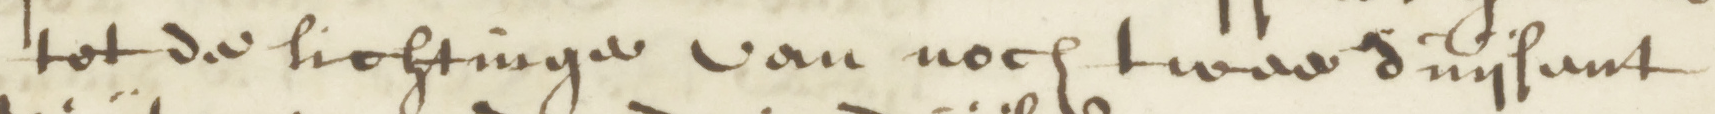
tot de lichtinge van noch twee duijsent
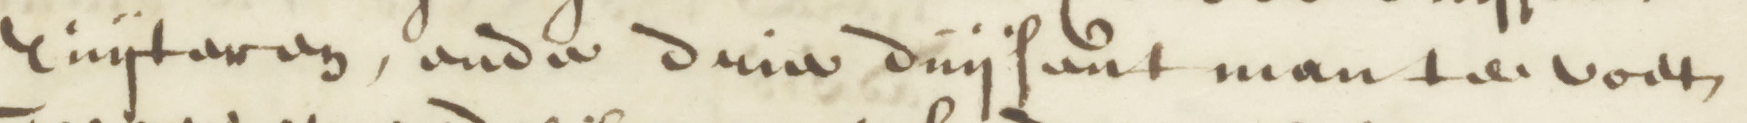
ruijteren, ende drie duijsent man te voet.
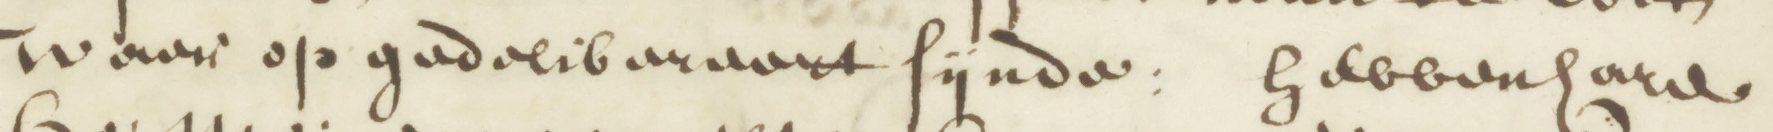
Waer op gedelibereert sijnde: hebben hare
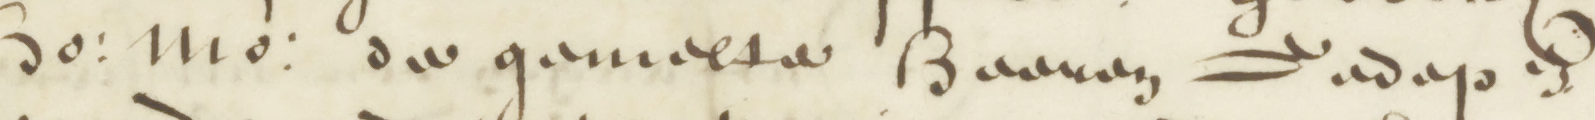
Ho:Mo: de gemelte Heeren Gedepen
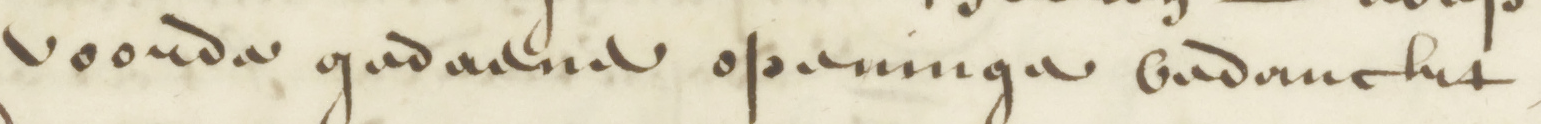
voorde gedaene openinge bedanckt.
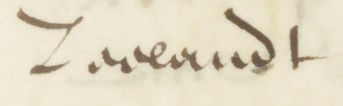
Zeelandt
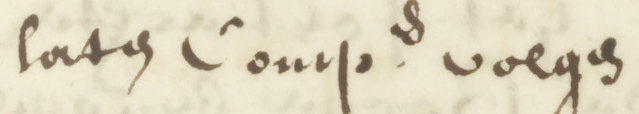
late Compen. volgen
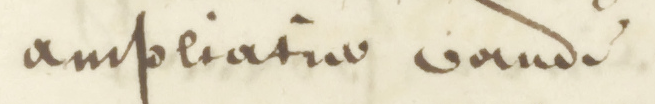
ampliatie vande
